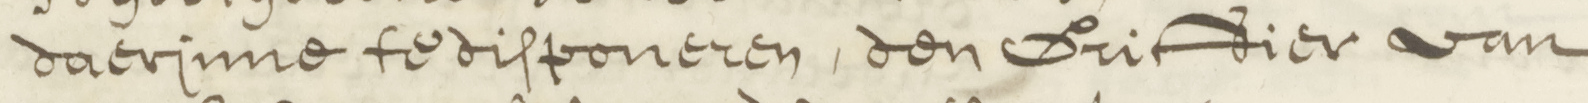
daerinne te disponeren, den Griffier van
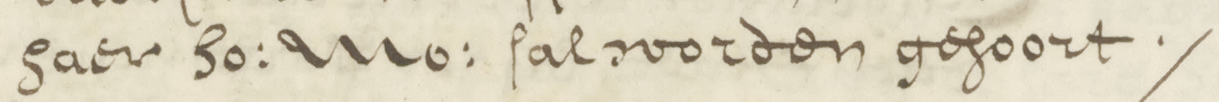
haer ho:Mo: sal worden gehoort.
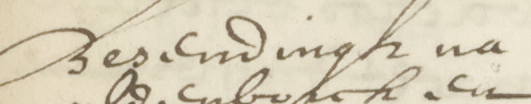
Besendingh na
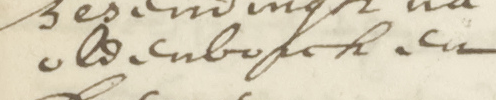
oldenborch en
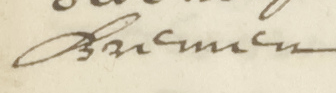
Bremen
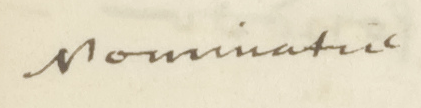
Nominatie
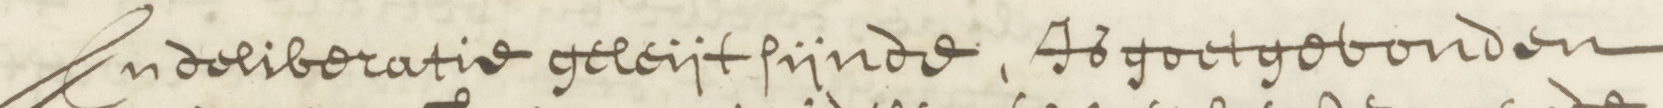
In deliberatie geleijt sijnde, Is goetgevonden
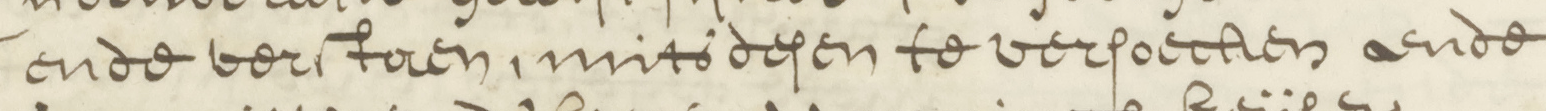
ende verstaen, mits desen te versoecken ende
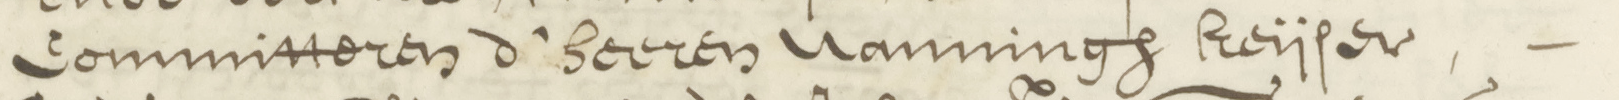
committeren d'heeren Nanningh Keijser, -
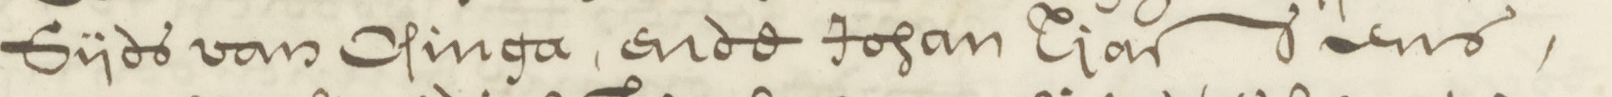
Sijds van Osinga, ende Johan Tjassens,
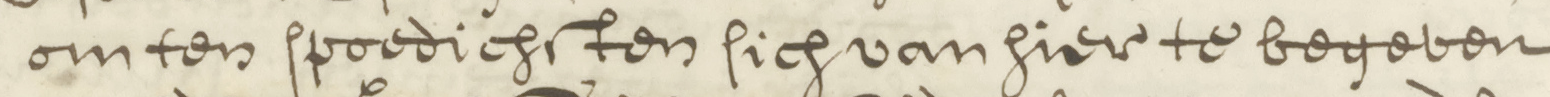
om ten spoedichsten sich van hier te begeven
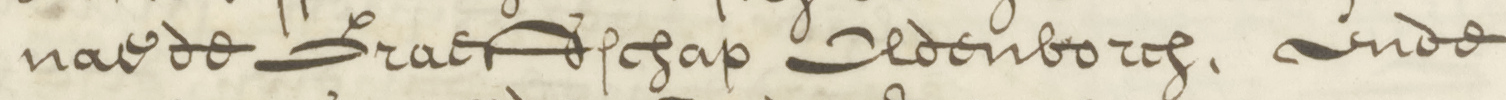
nae de Graeffschap Oldenborch, ende
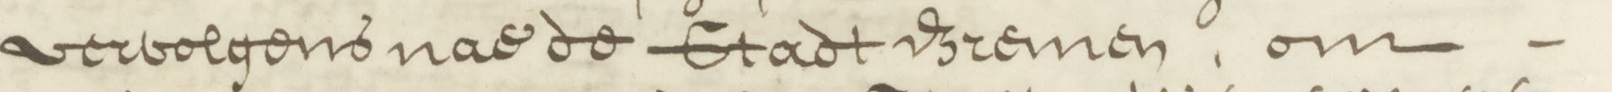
vervolgens nae de Stadt Bremen, om -
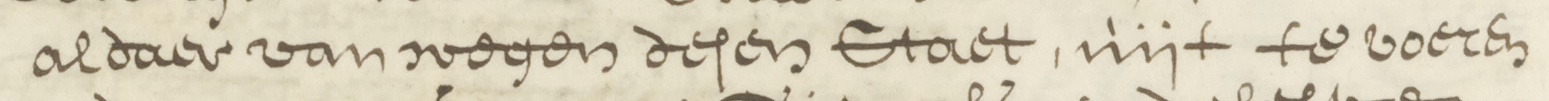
aldaer van wegen desen Staet, uijt te voeren
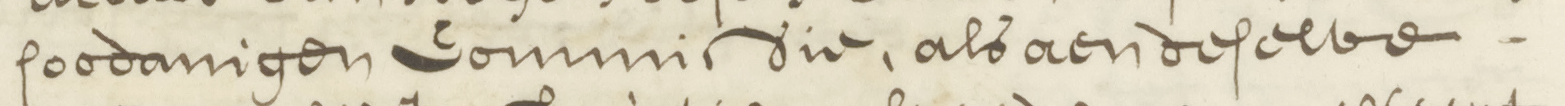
soodanigen Commissie, als aen deselve -
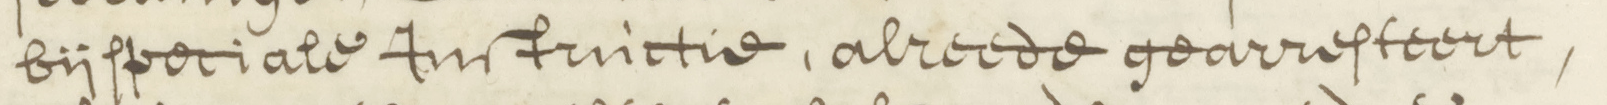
bij speciale Instructie, alreede gearresteert,
